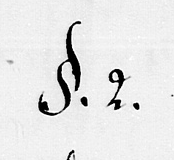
§. 2.
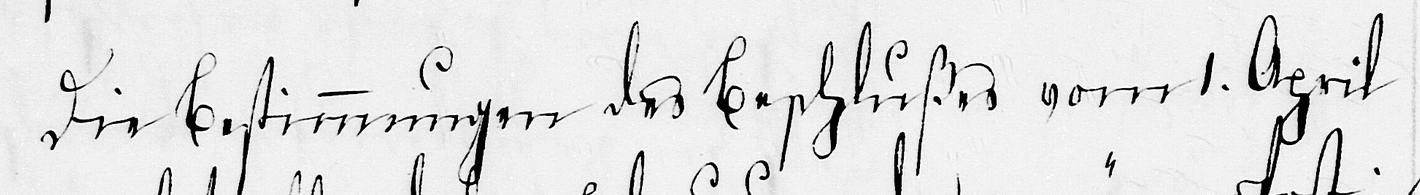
Die Bestimmungen des Beschlußes vom 1. April
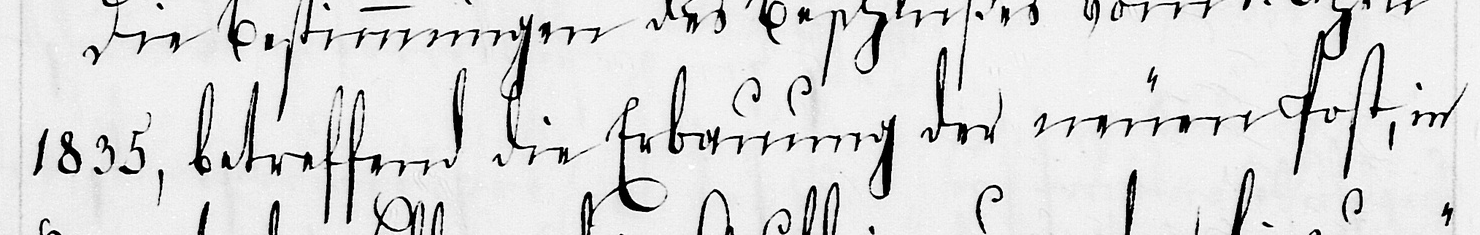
1835, betreffend die Erbauung der neuen Post, in
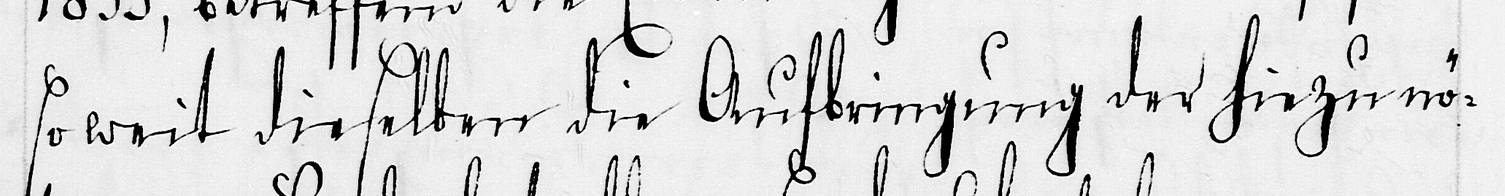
so weit dieselben die Aufbringung der hiezu nö¬
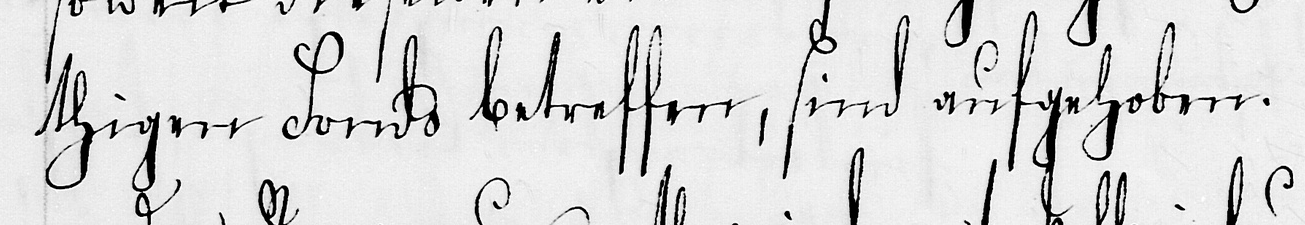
thigen Fonds betreffen, sind aufgehoben.
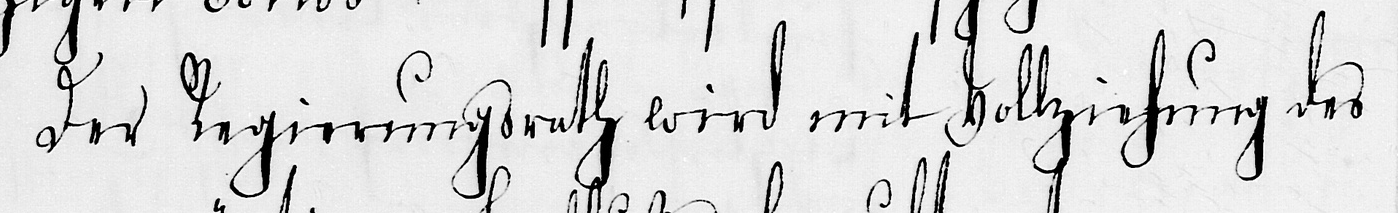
Der Regierungsrath wird mit Vollziehung des
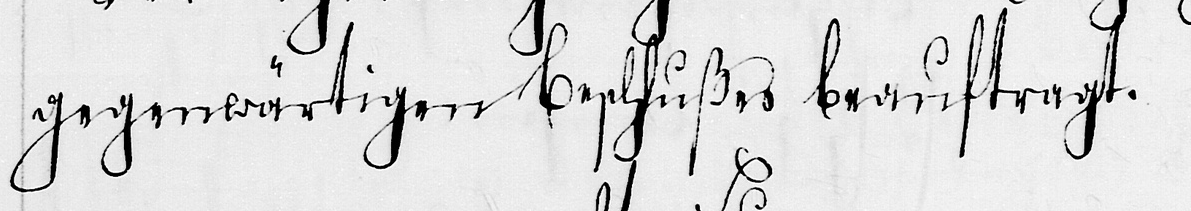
gegenwärtigen Beschlußes beauftragt.
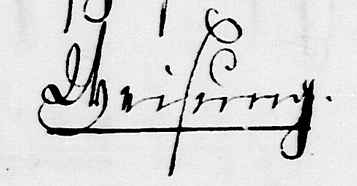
Weisung.
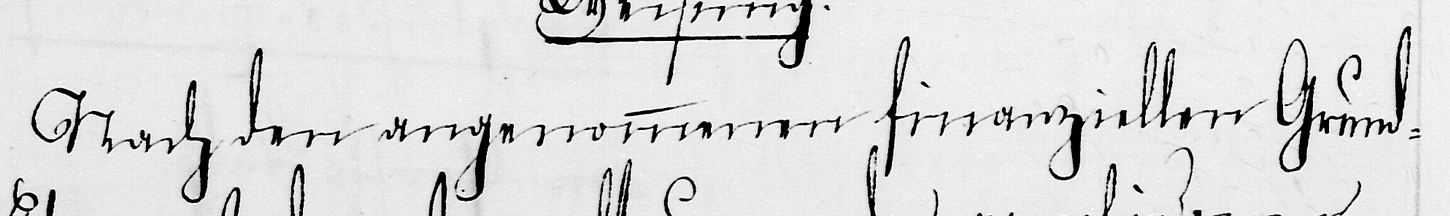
Nach den angenommenen finanziellen Grund¬
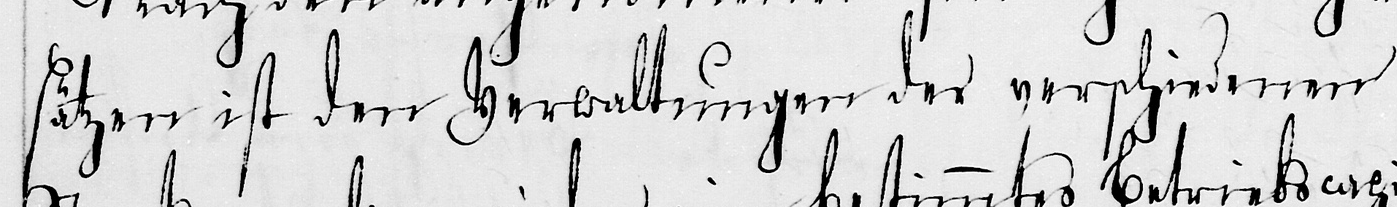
sätzen ist den Verwaltungen der verschiedenen
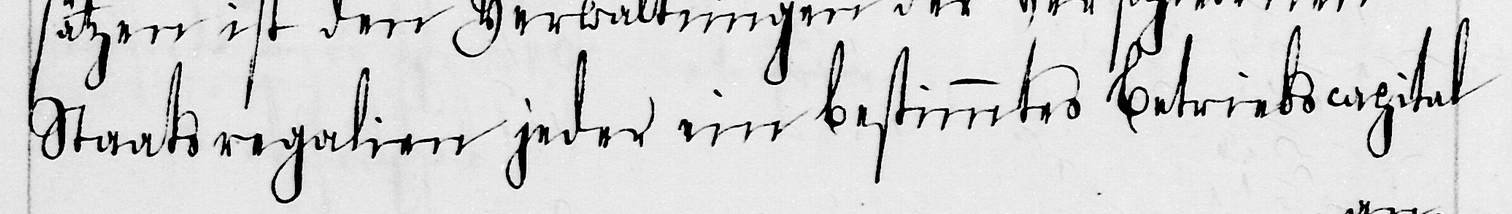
Staatsregalien jeder ein bestimmtes Betriebscapital
